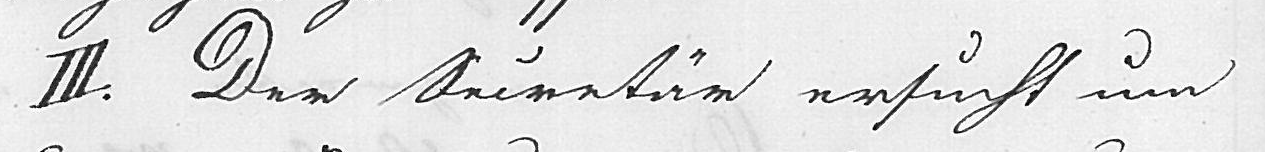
III. Der Secretär ersucht um
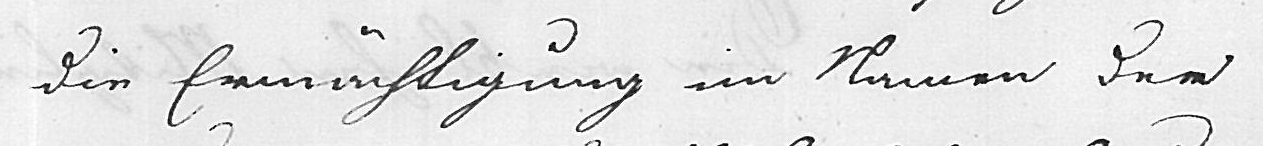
die Ermächtigung im Namen der
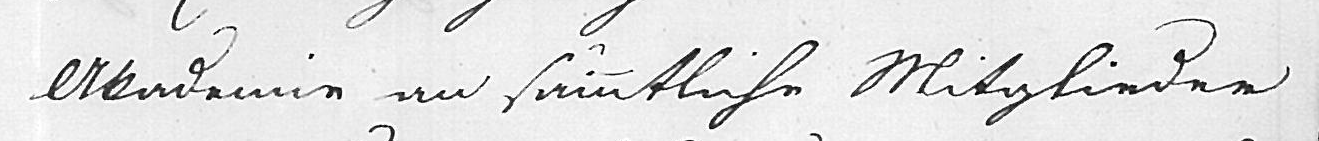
Akademie an sämmtliche Mitglieder
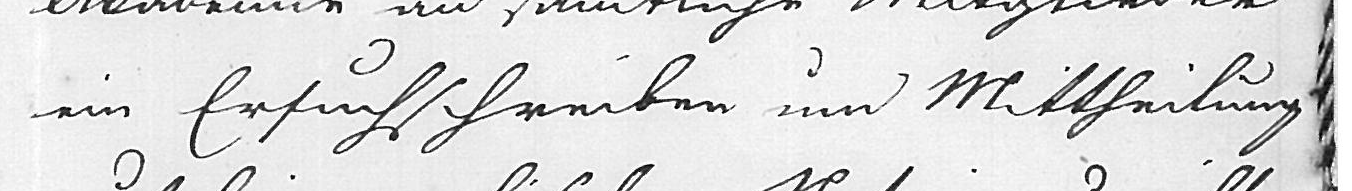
ein Ersuchschreiben um Mittheilung
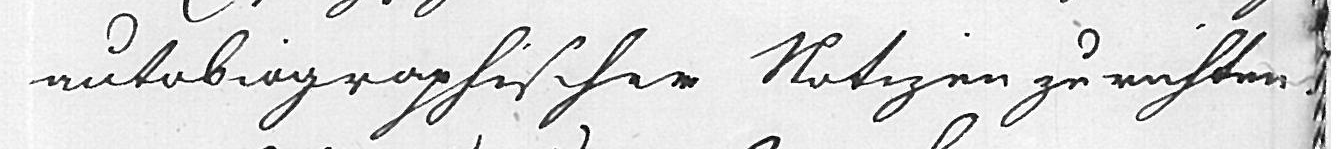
autobiographischer Notizen zu richten.
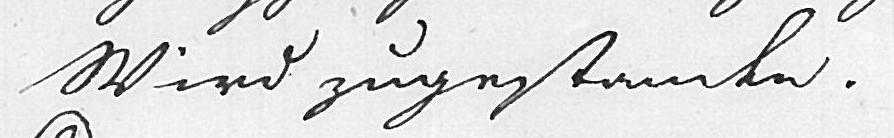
Wird zugestanden.
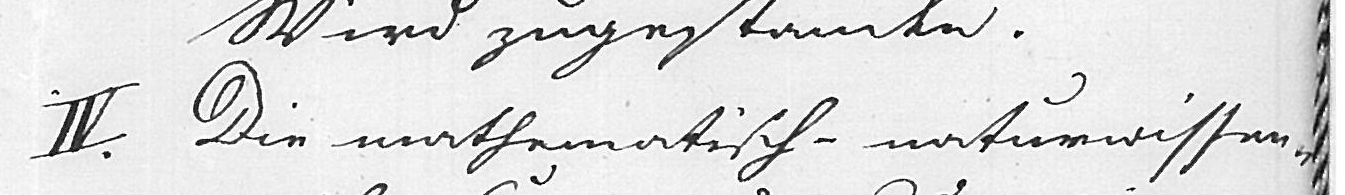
IV. Die mathematisch-naturwissen-
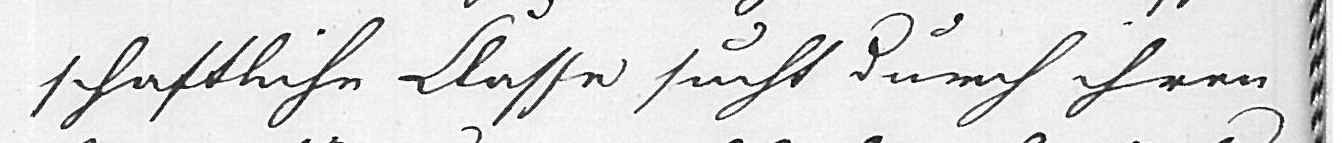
schaftliche Classe sucht durch ihren
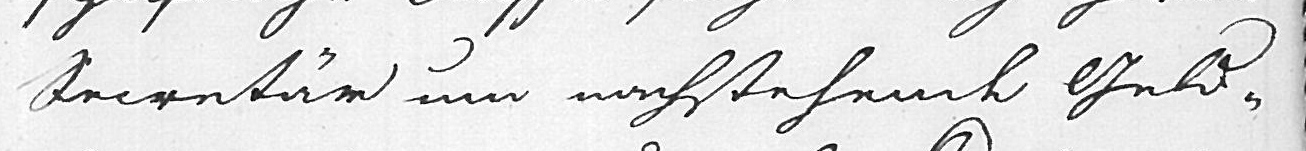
Secretär um nachstehende Geld-
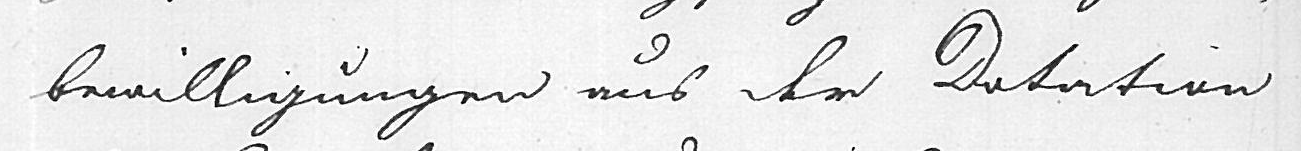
bewilligungen aus der Dotation
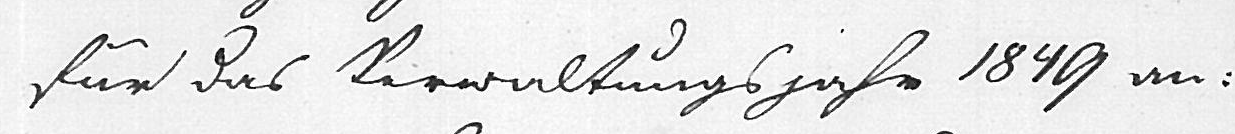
für des Verwaltungsjahr 1849 an:
